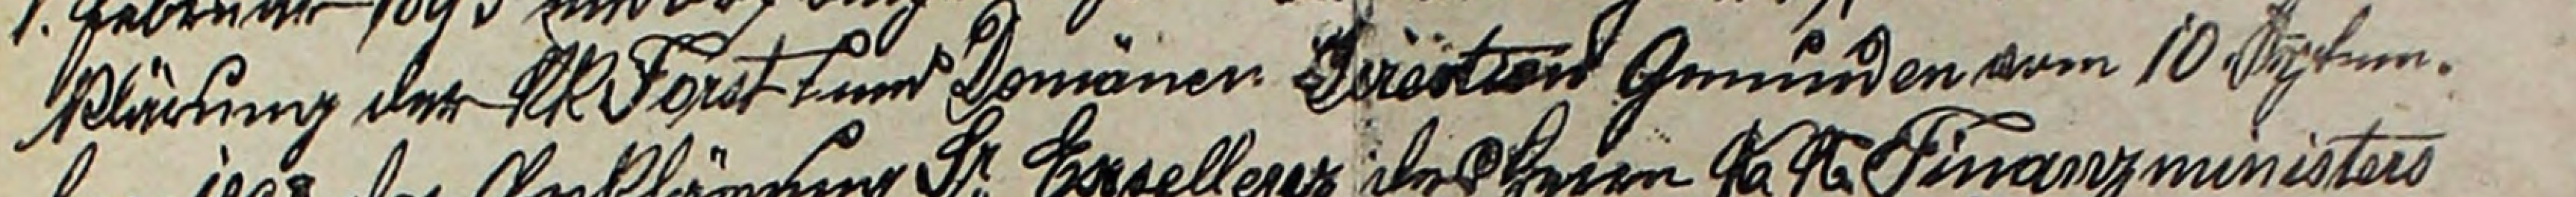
klärung der kk Forst und Domänen Direction Gmunden vom 10. Septem„
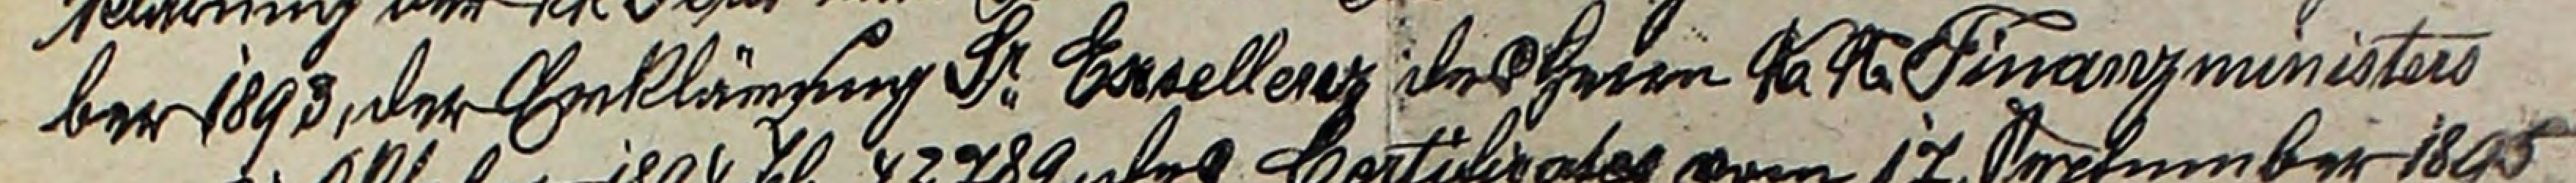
ber 1893, der Erklärung Sr Exsellenz des Herrn k.k. Finanzministers
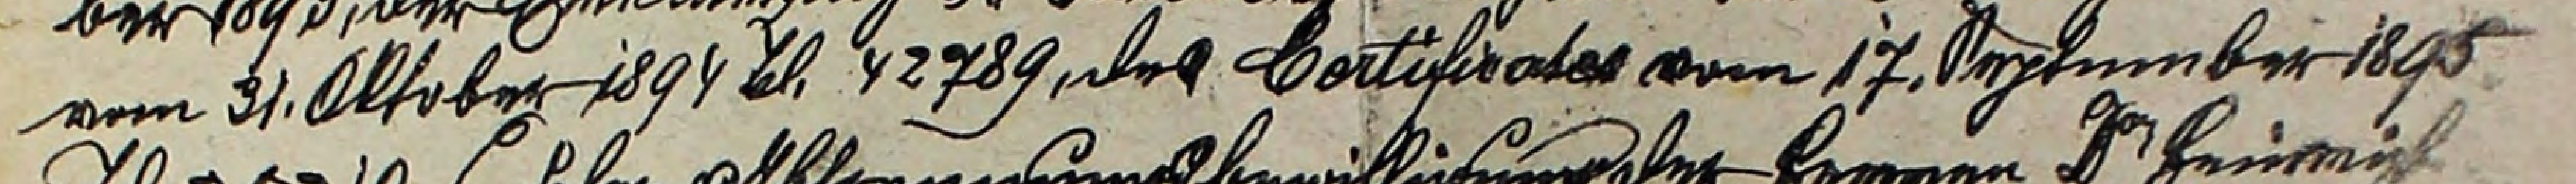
vom 31. Oktober 1894 Bl. 42789, des Certificates vom 17. September 1895
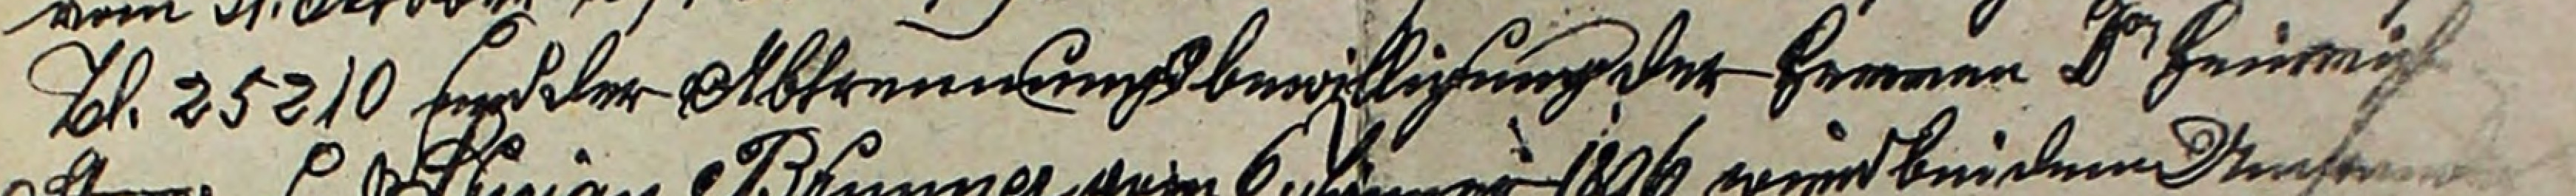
Bl. 25210 und der Abtrennungsbewilligung der Hemmen Dr Heinrich
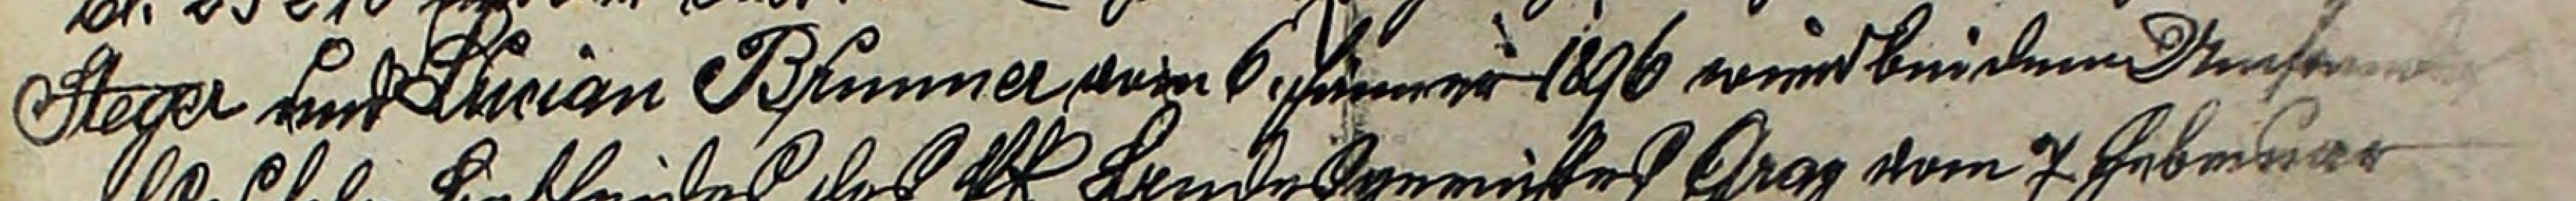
Steger und Lucian Brunner vom 6. Jänner 1896 würd bei dem Ums???
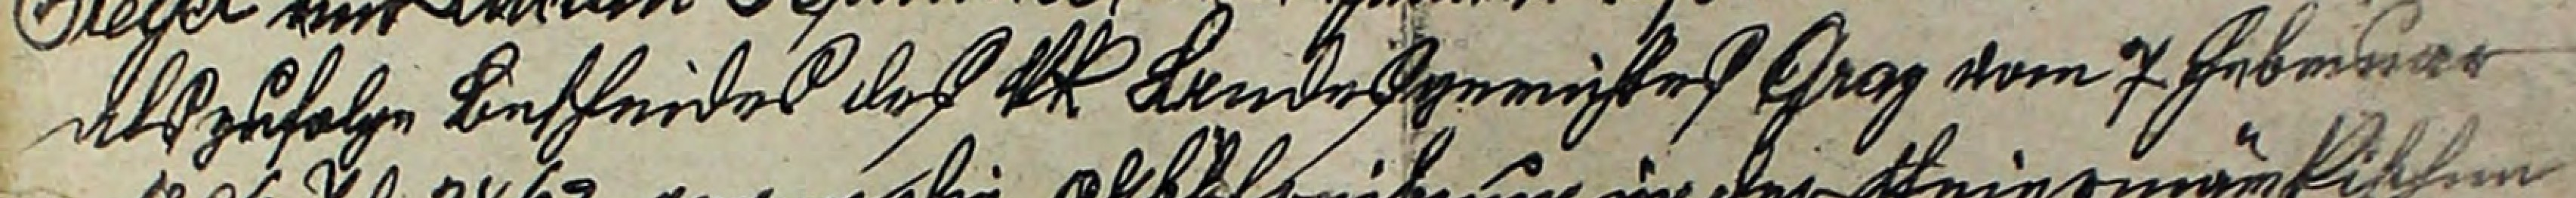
alszufolge Bescheides des kk Landesgerichtes Graz vom 7. Februar
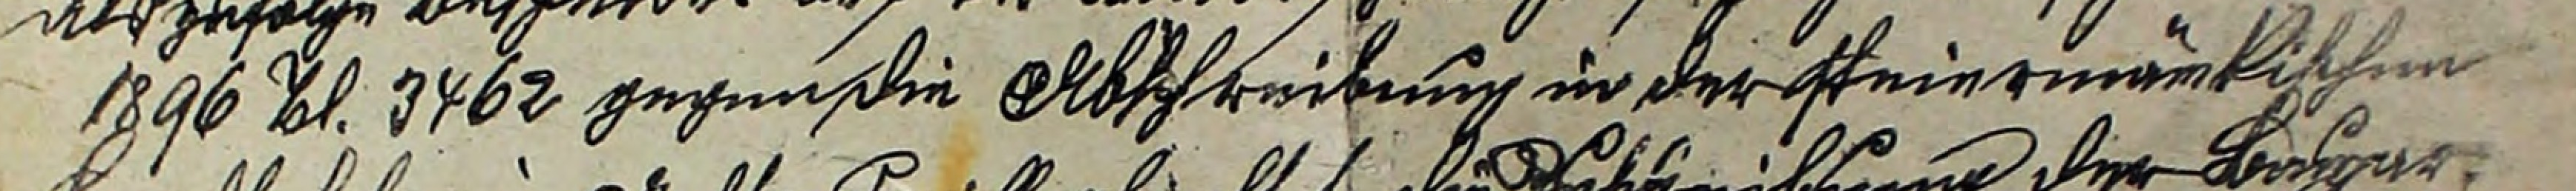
1896 Bl. 3462 gegen die Abschreibung in der steiermämkischen
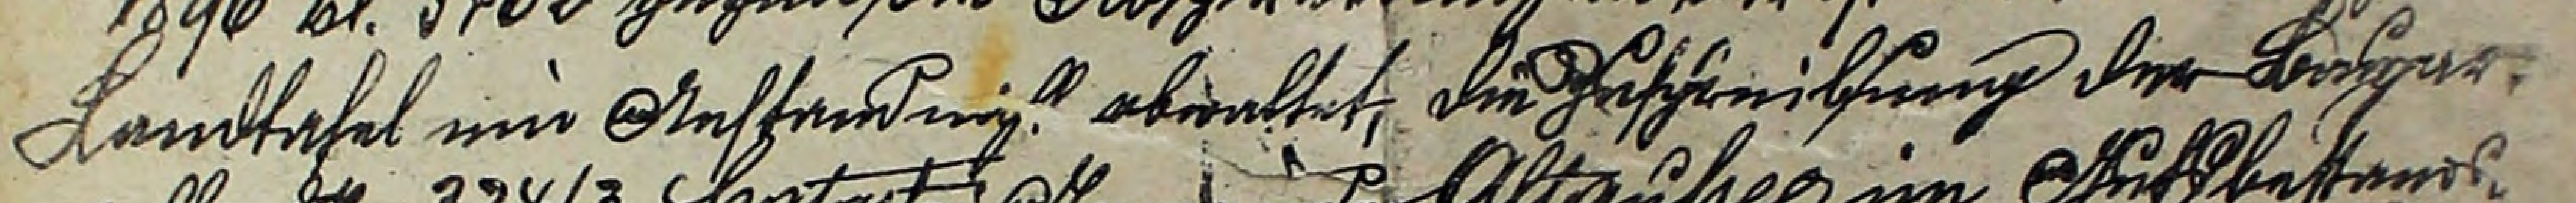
Landtafel ein Anstandnicht obwaltet, die Zuschreibung der Baupar„
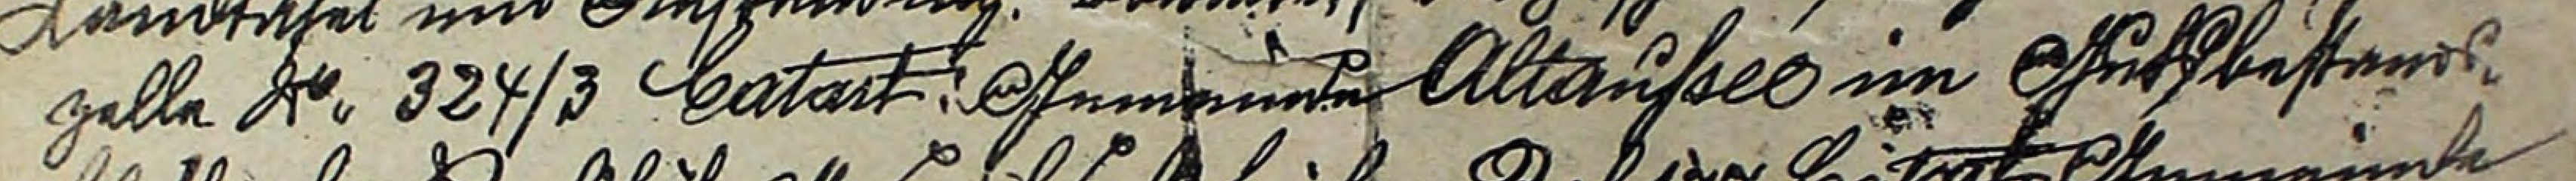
zelle No 324/3 Catast: Gemeinde Altaussee im Gutsbestands„
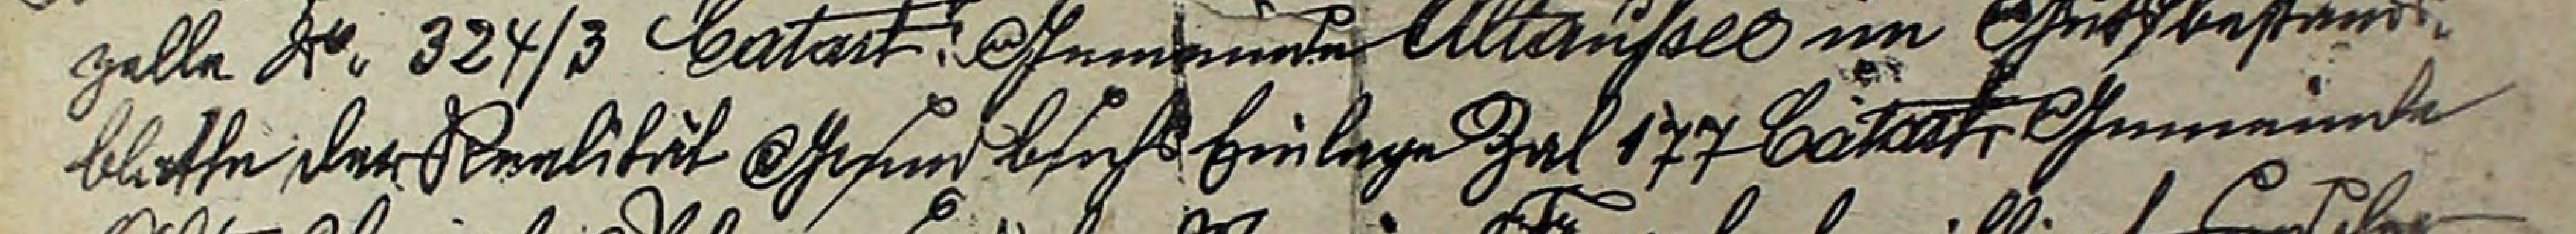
blasse der Realität Grund Buchs Einlage Zal 177 Catastr Gemeinde
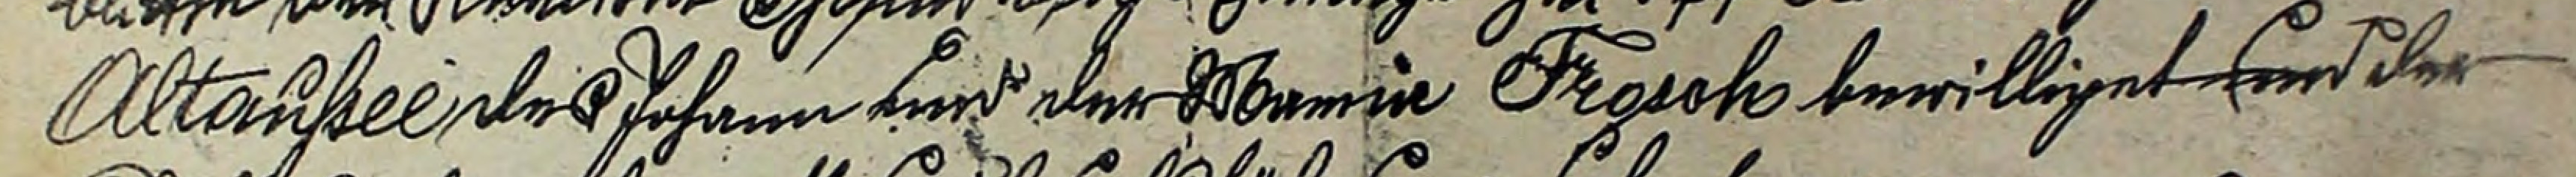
Altaussee des Johann und der Maria Frosch bewilliget und der
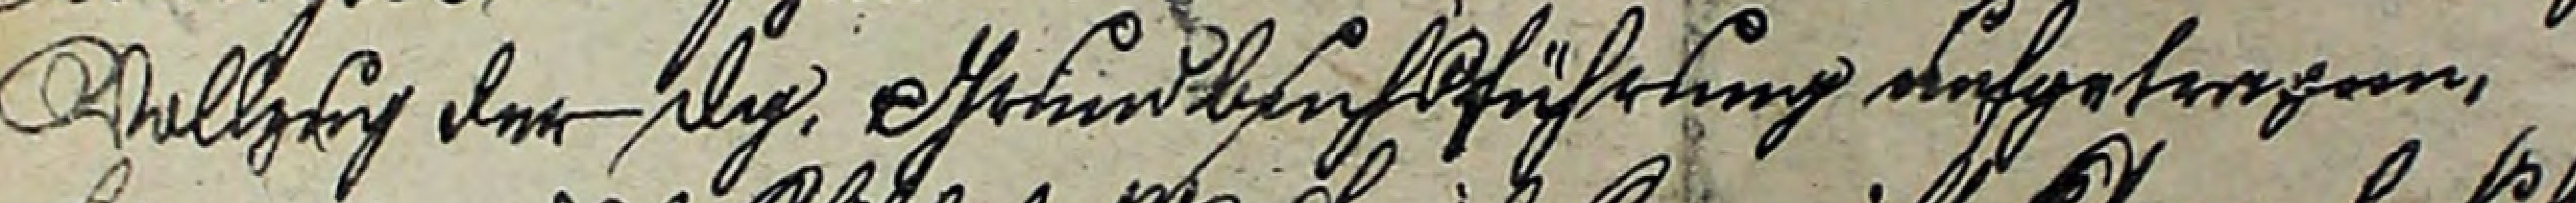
Vollzug der dg. Grundbuchsführung aufgetragen,
